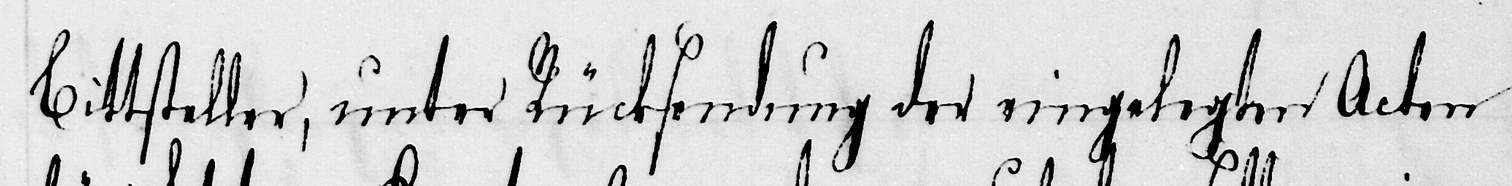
Bittsteller, unter Rücksendung der eingelegten Acten
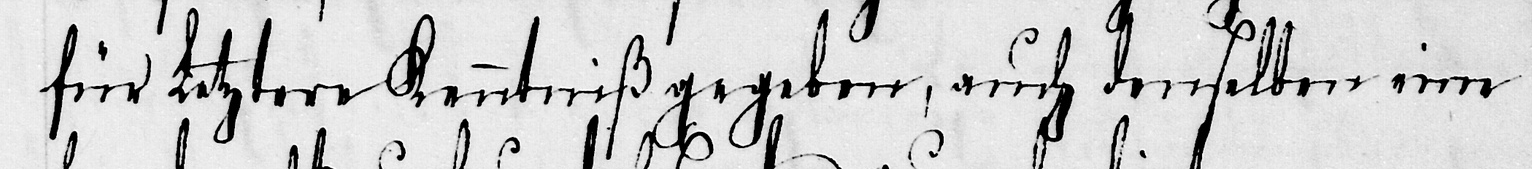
für Letztere Kenntniß gegeben, auch denselben eine
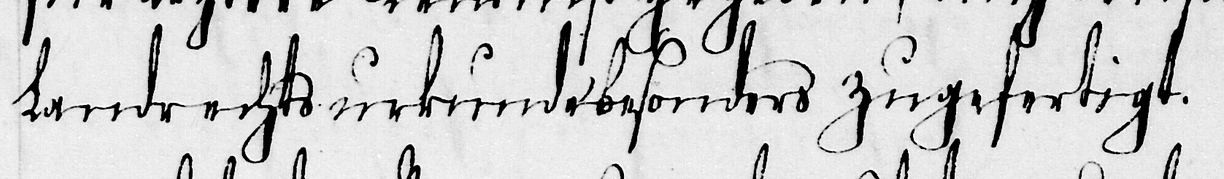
Landrechtsurkunde besonders zugefertigt.
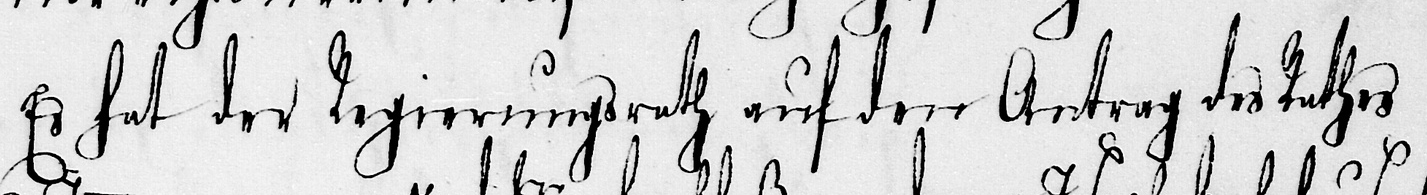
Es hat der Regierungsrath auf den Antrag des Rathes
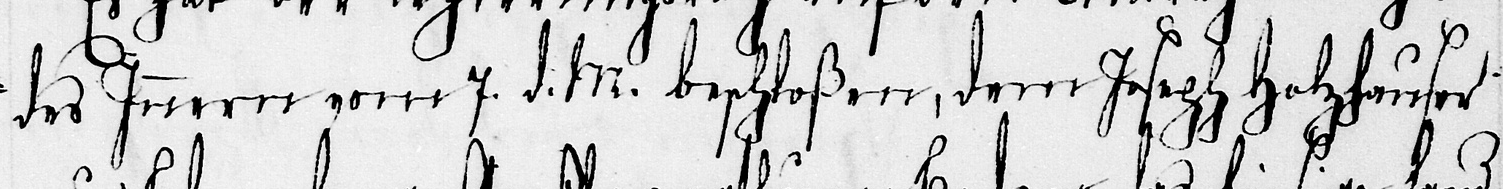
des Innern vom 7. d. M. beschloßen, dem Joseph Holzhauser
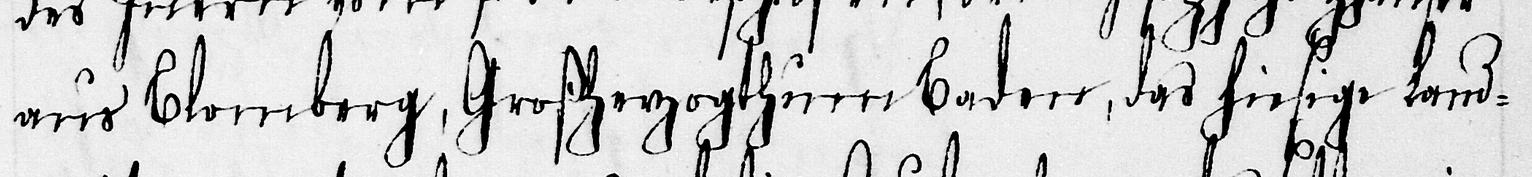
aus Blomberg, Großherzogthum Baden, das hiesige Land¬
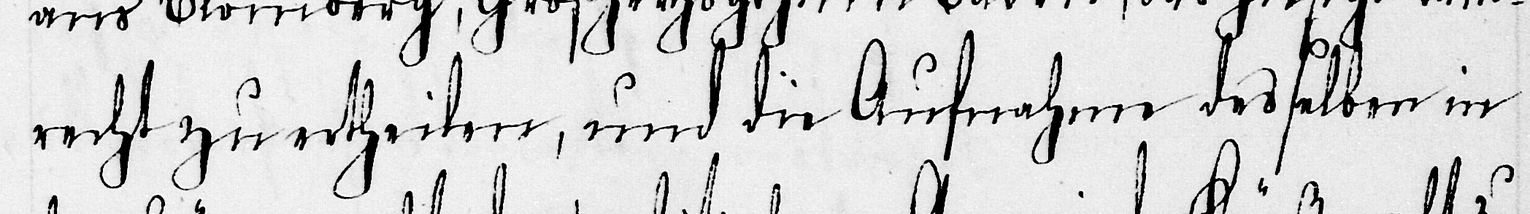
recht zu ertheilen, und die Aufnahme desselben in
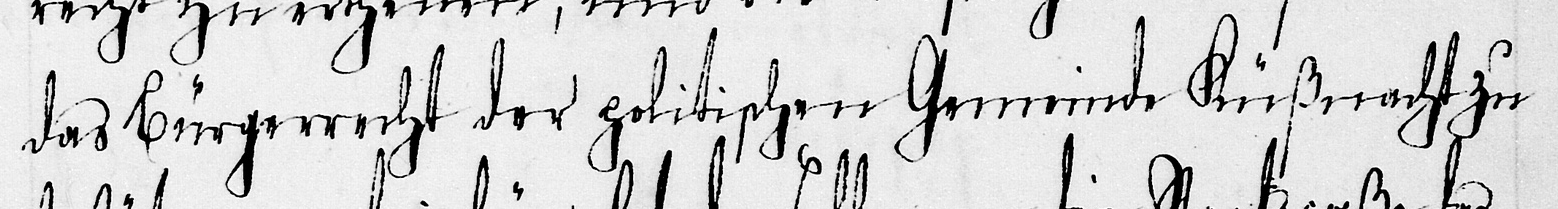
das Bürgerrecht der politischen Gemeinde Küßnacht zu
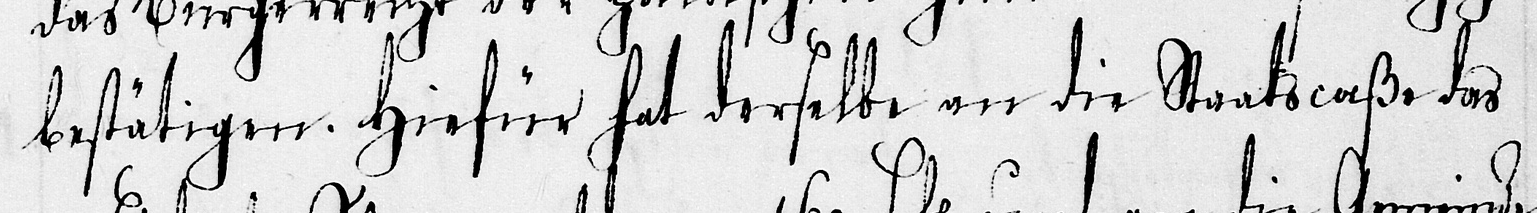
bestätigen. Hiefür hat derselbe an die Staatscaße das
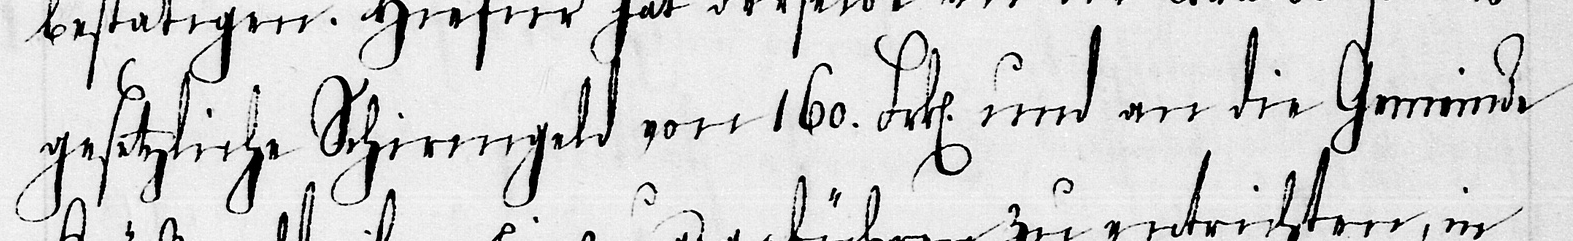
gesetzliche Schirmgeld von 160. Frk[en]. und an die Gemeinde
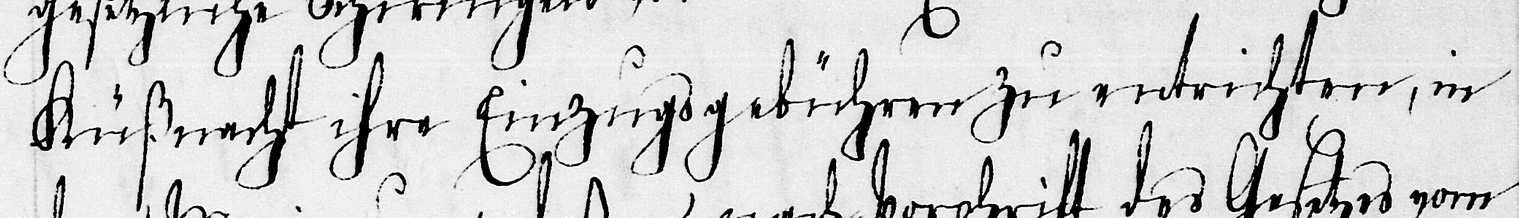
Küßnacht ihre Einzugsgebühren zu entrichten, in
